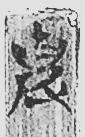尅
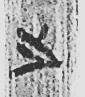之
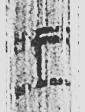王
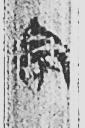命
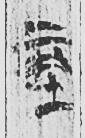坪
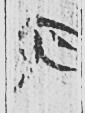亦
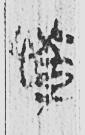悼
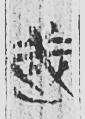武
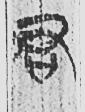君
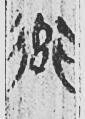率
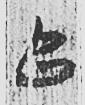𠂤
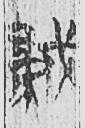{帚戈}
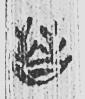晉
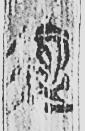逾
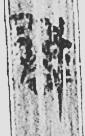{口幸阝}
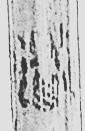{止頁戈}
